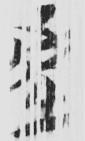○（吾）
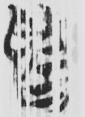既
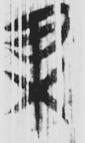果
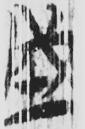城（成）
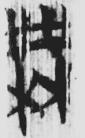無
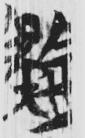鐸（射）
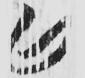㠯（以）
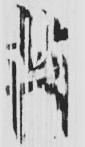共（供）
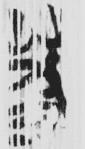萅（春）
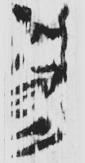○（秋）
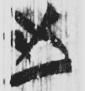之
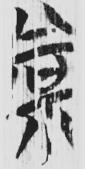○（嘗）
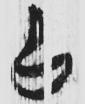㠯
